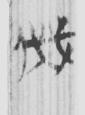俴
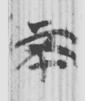不
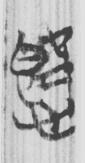{既心}
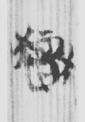獄
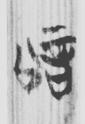訟
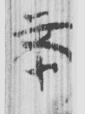不
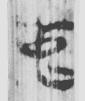𠁩
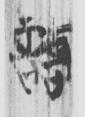詒
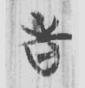告
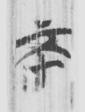不
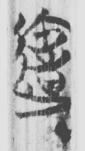達
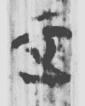正
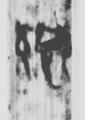卿
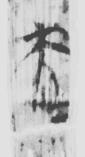夫=
